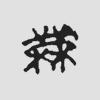無
